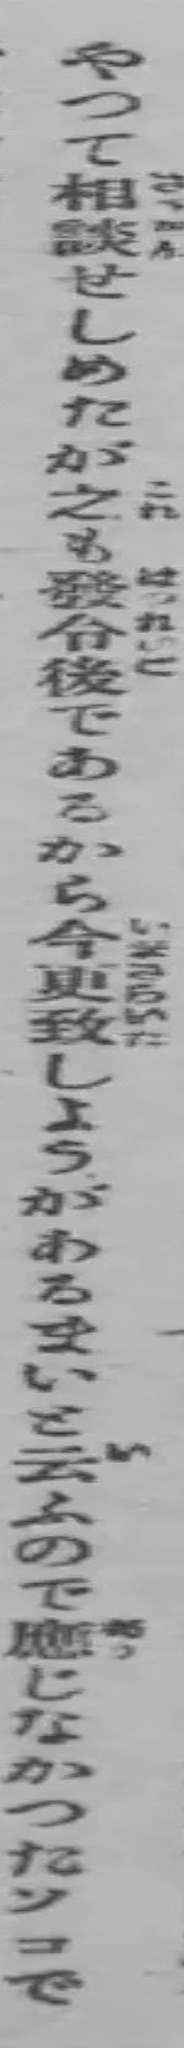やつて相談せしめたが之も発令後であるから今更致しようがあるまいと云ふので応じなかつたソコで
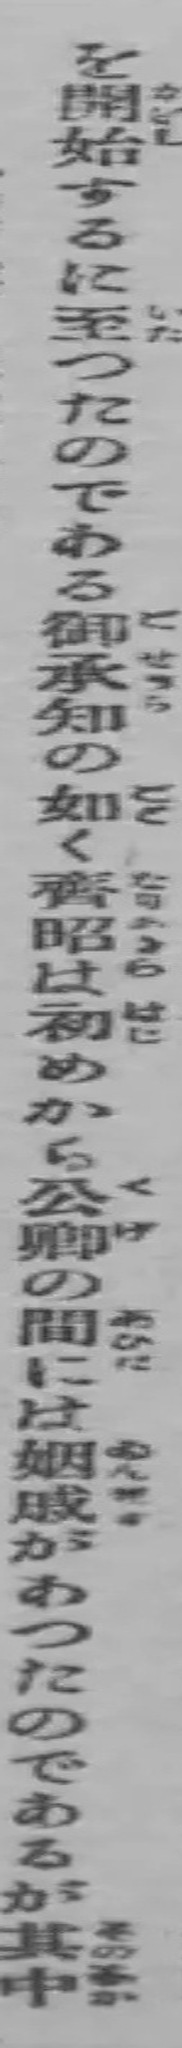を開始するに至つたのである御承知の如く斉昭は初めから公卿の間には姻戚があつたのであるが其中
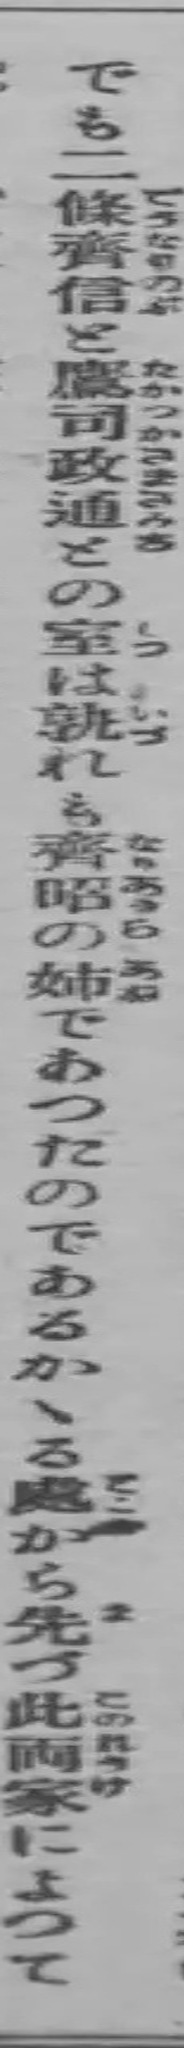でも二條斉信と鷹司政通との室は孰れも斉昭の姉であつたのであるかゝる処から先づ此両家によつて
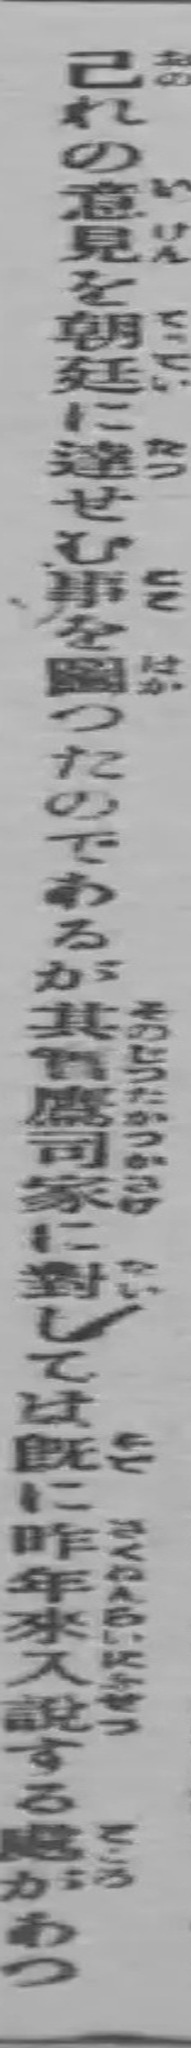己れの意見を朝廷に達せむ事を図つたのであるが其実鷹司家に対しては既に昨年来入説する処があつ
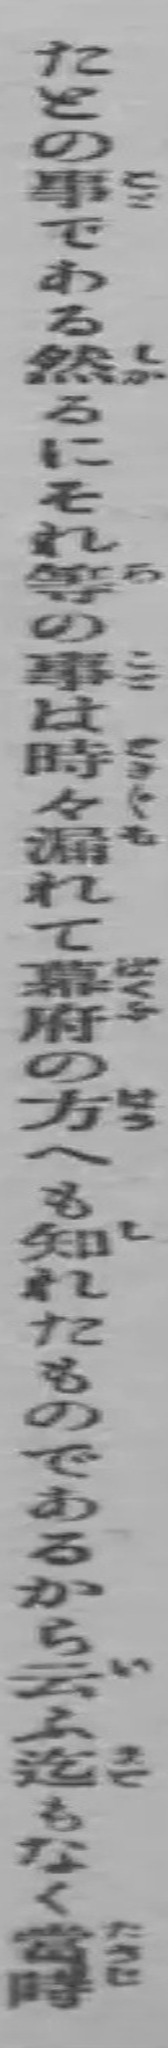たとの事である然るにそれ等の事は時々漏れて幕府の方へも知れたものであるから云ふ迄もなく当時
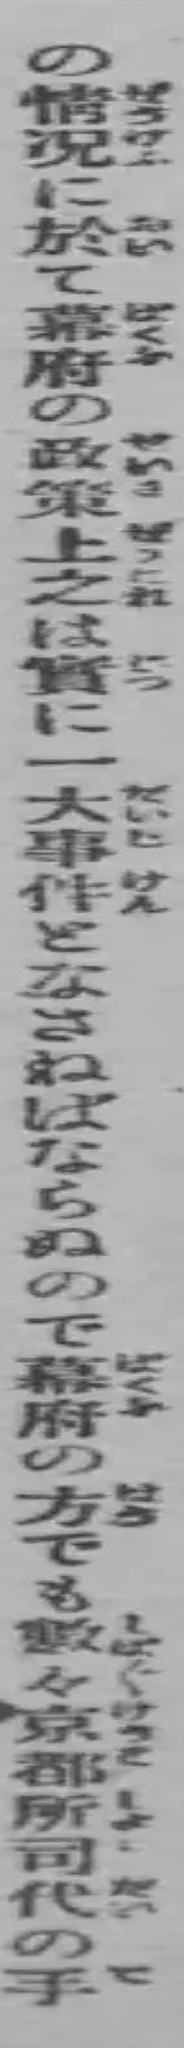の情況に於て幕府の政策上之は実に一大事件となさねばならぬので幕府の方でも数々京都所司代の手
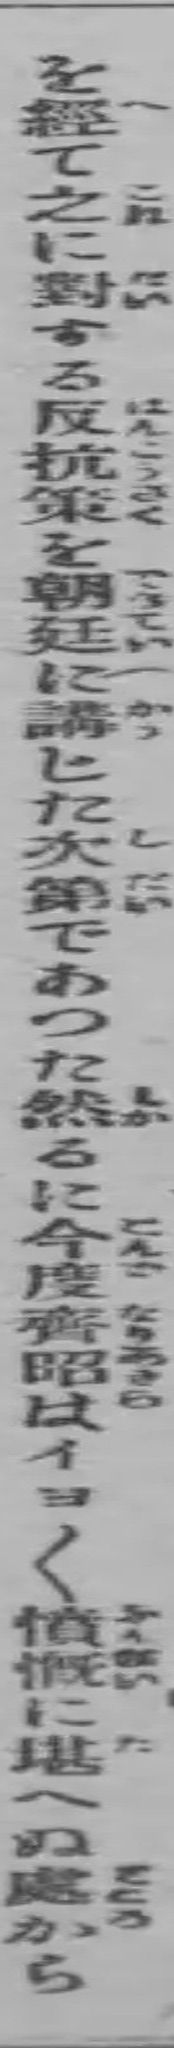を経て之に対する反抗策を朝廷に講じた次第であつた然るに今度斉昭はイヨ〳〵憤慨に堪へぬ処から
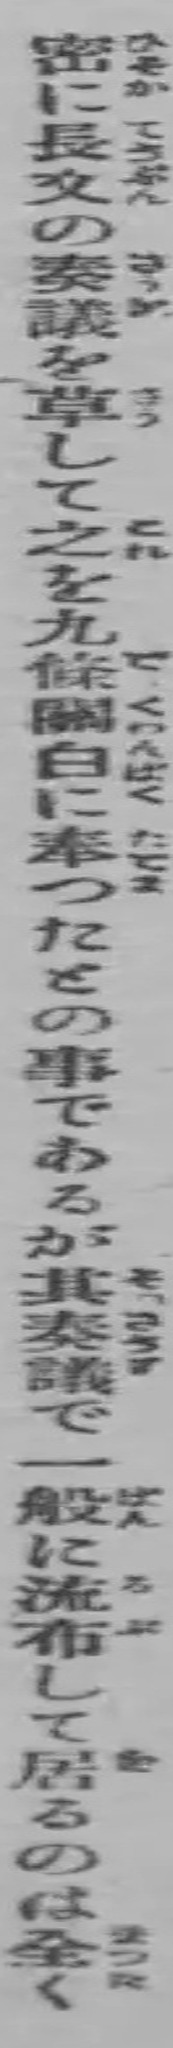密に長文の奏議を草して之を九条関白に奉つたとの事であるが其奏議で一般に流布して居るのは全く
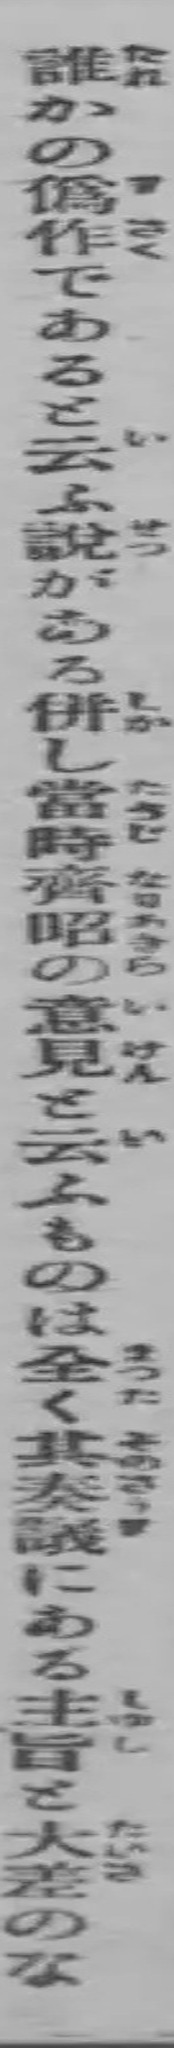誰かの偽作であると云ふ説がある併し当時斉昭の意見と云ふものは全く其奏議にある主旨と大差のな
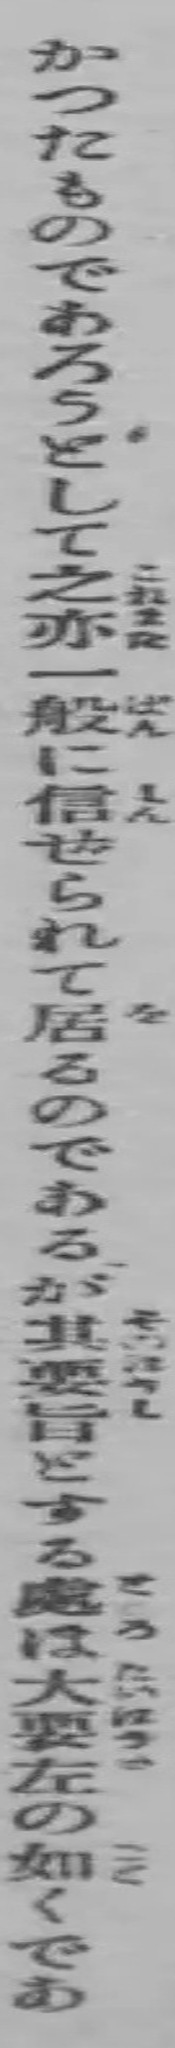かつたものであろうとして之亦一般に信ぜられて居るのであるが其要旨とする処は大要左の如くであ
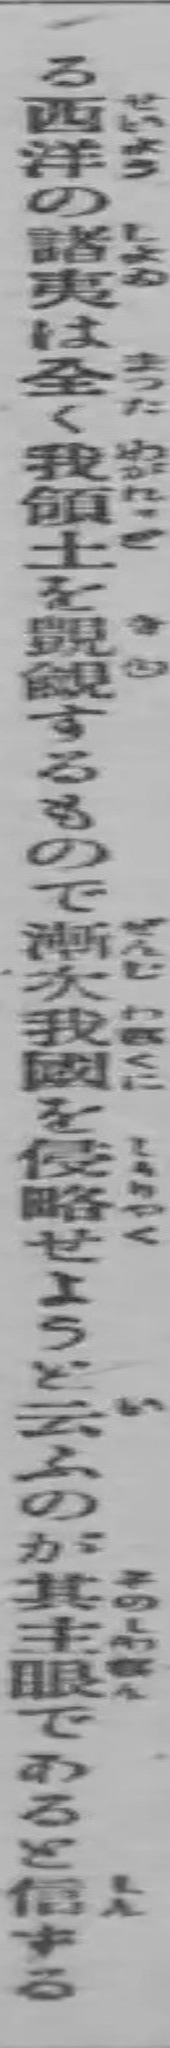る西洋の諸夷は全く我領土を覬覦するもので漸次我国を侵略せようと云ふのが其主眼であると信ずる
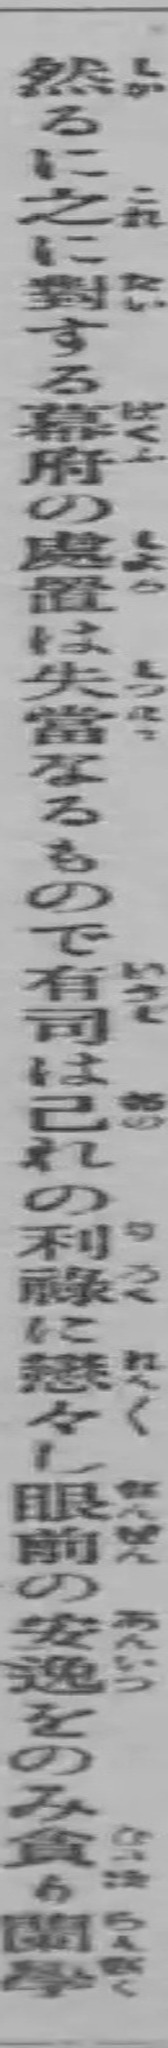然るに之に対する幕府の処置は失当なるもので有司は己れの利禄に恋々し眼前の安逸をのみ貪り蘭学
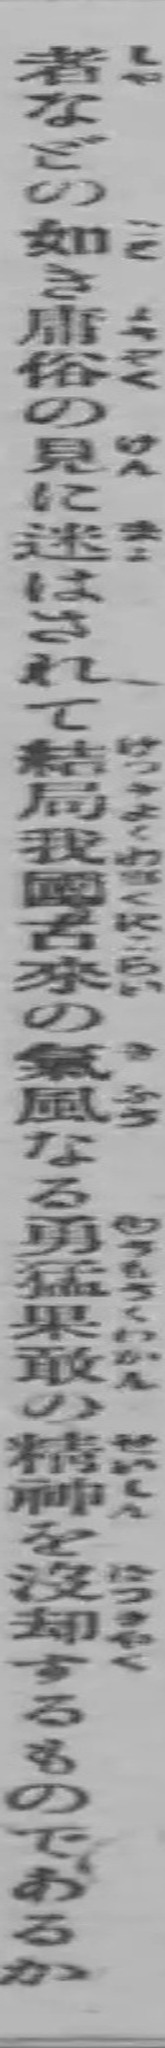者などの如き庸俗の見に迷はされて結局我国古来の気風なる勇猛果敢の精神を没却するものであるか
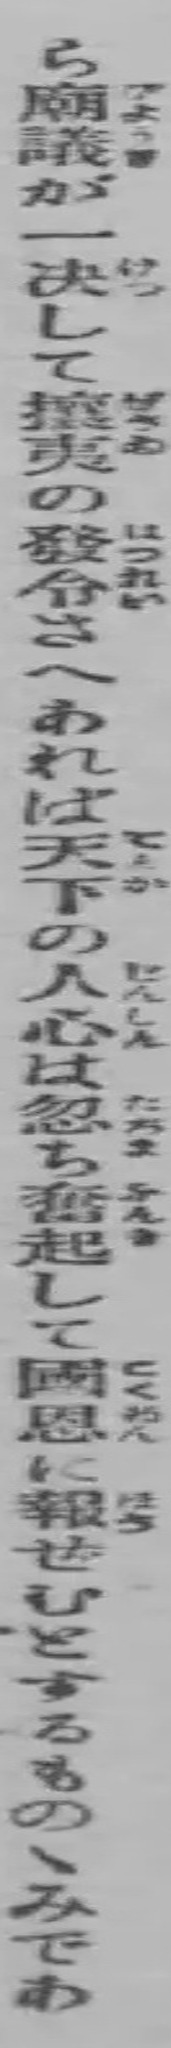ら廟議が一決して攘夷の発令さへあれば天下の人心は忽ち奮起して国恩に報ぜむとするものヽみであ
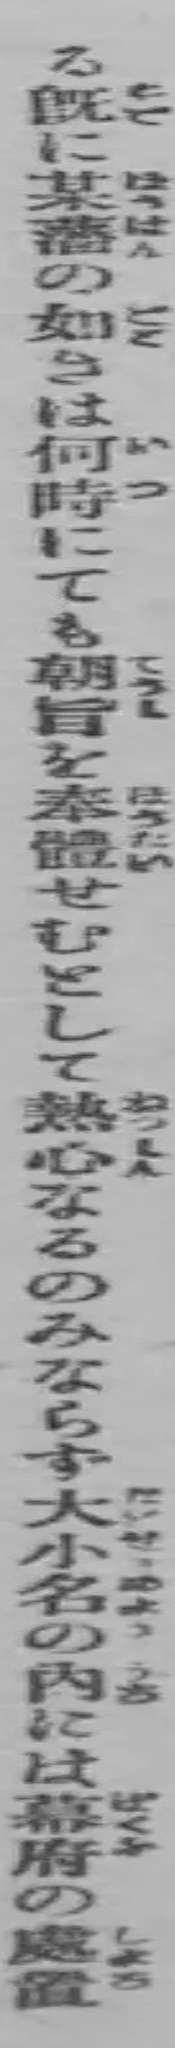る既に某藩の如きは何時にても朝旨を奉體せむとして熱心なるのみならず大小名の内には幕府の処置
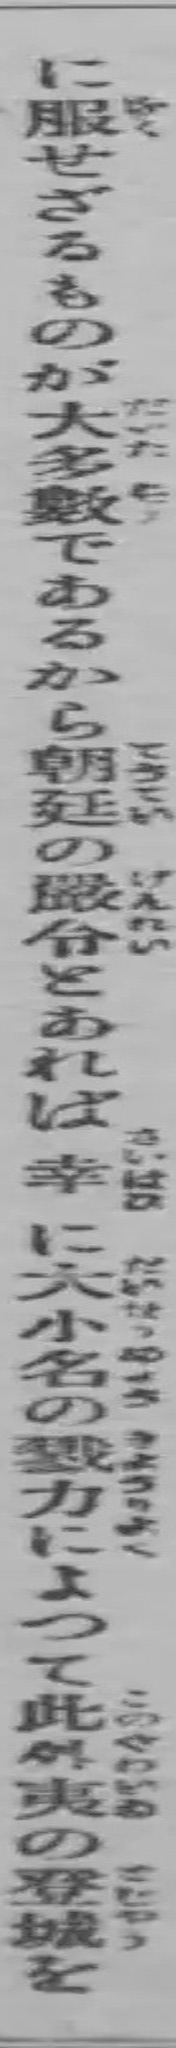に服せざるものが大多数であるから朝廷の厳令とあれば幸に大小名の戮力によつて此外夷の登城を
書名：豊橋市史談
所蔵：国立国会図書館 National Diet Library, JAPAN
